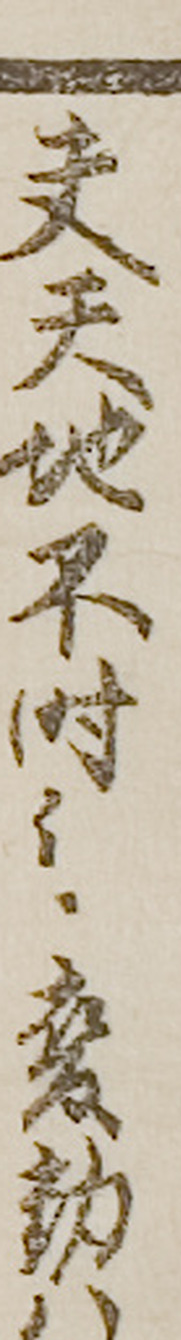夫天地不時之変動は
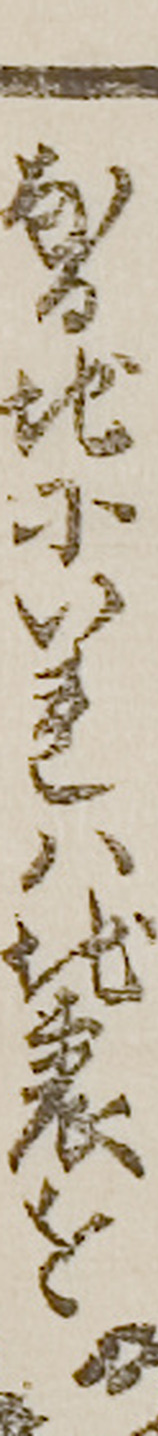なる地にいれは地震を
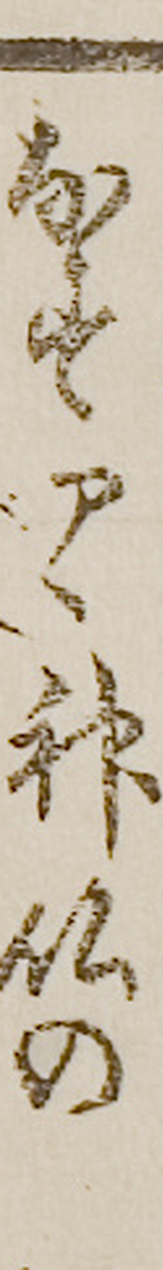なすアゝ神仏の
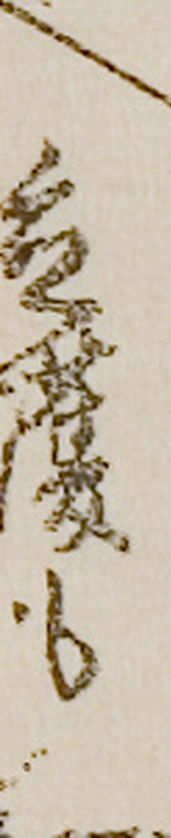応護も
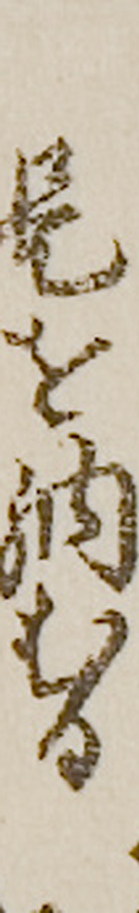是を納むる
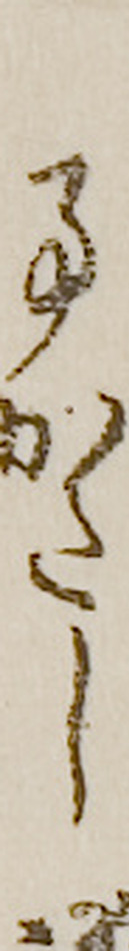事かたし
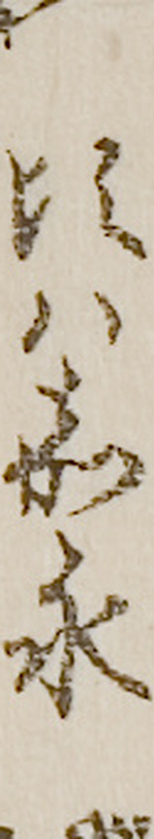比は嘉永
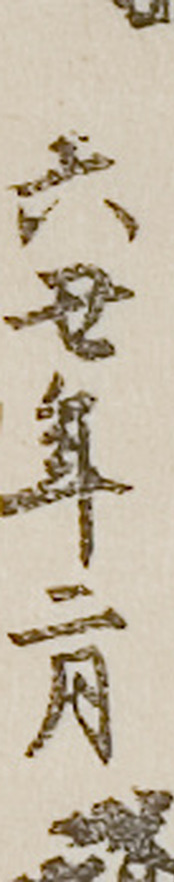六丑年二月
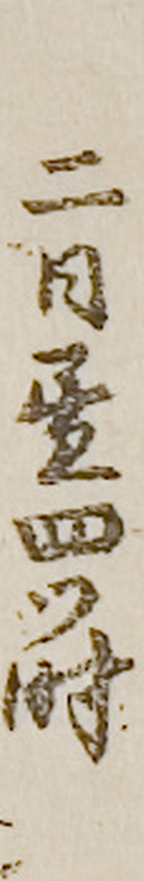二日昼四つ時
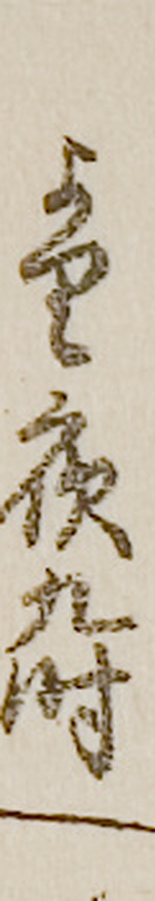より夜九時
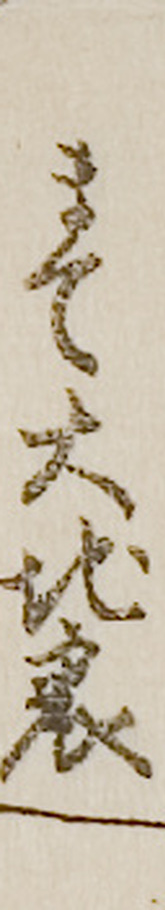まて大地震
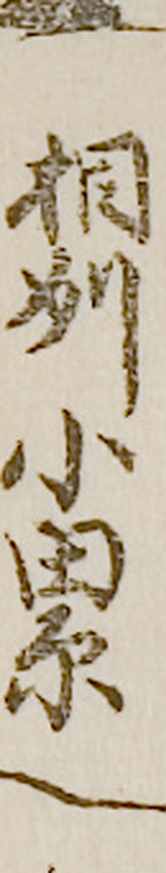相州小田原
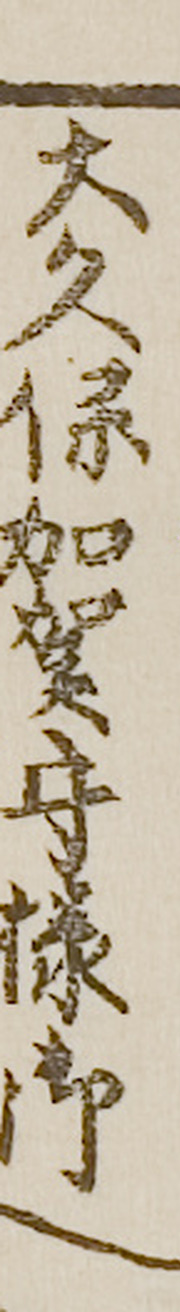大久保加賀守様御
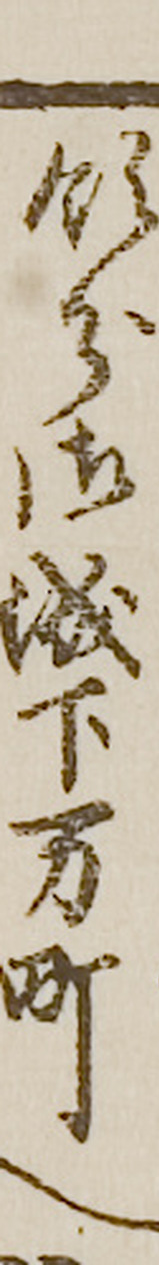領分御城下万町
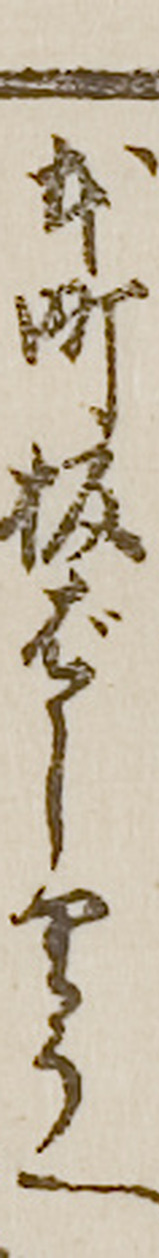本町板ばしりう
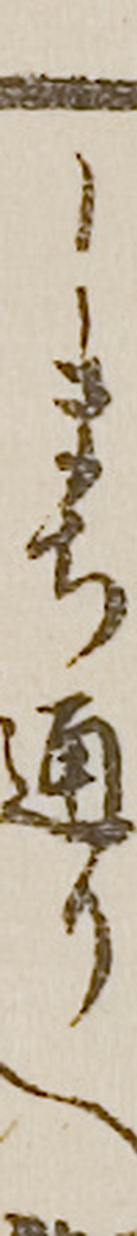しまち通り
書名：[嘉永六丑年二月二日相州地震]
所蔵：東京大学総合図書館 General Library in the University of Tokyo, JAPAN
